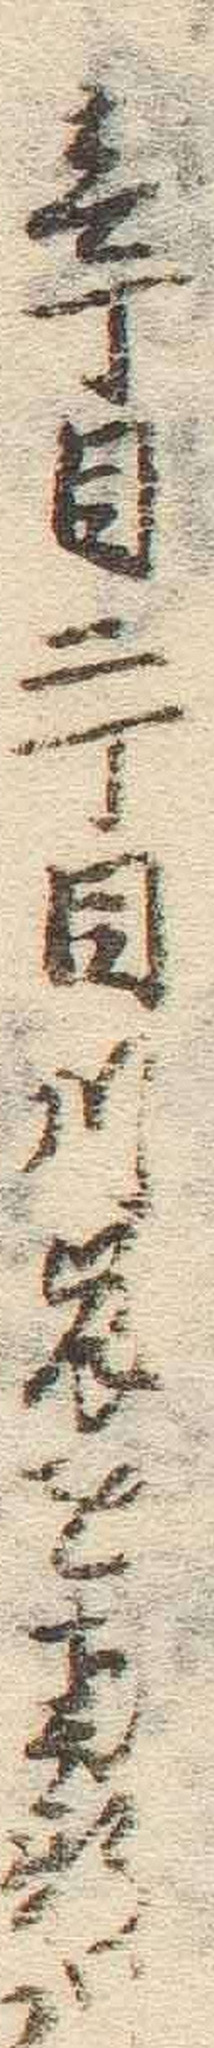壱丁目二丁目川岸を南新川
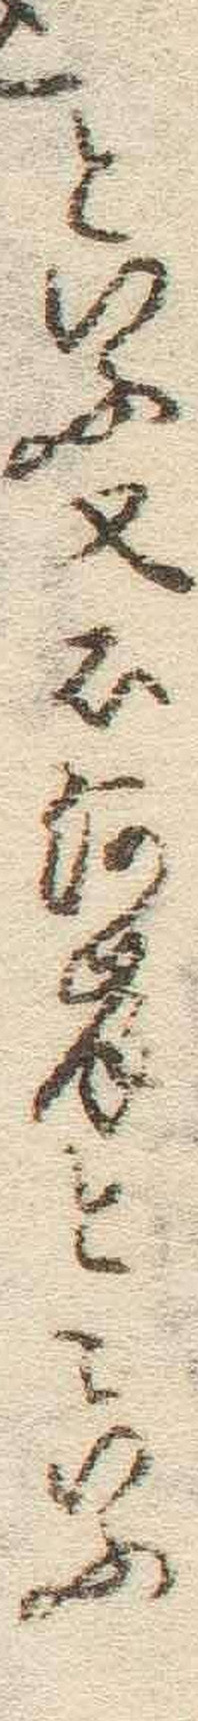といふ又石河岸ともいふ
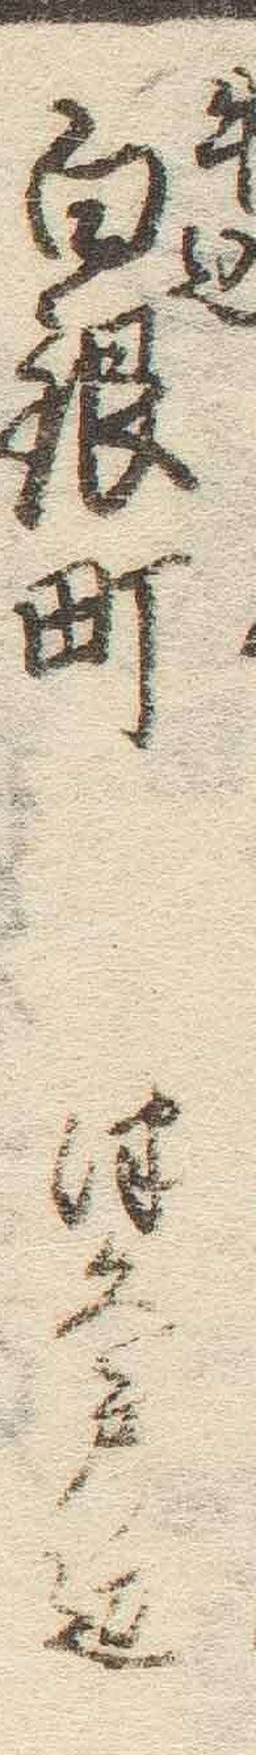白銀町津久戸ノ辺
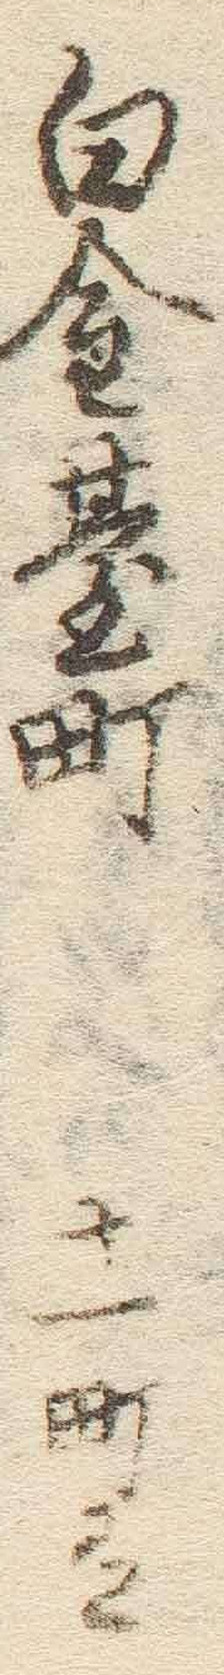白金台町十一町有
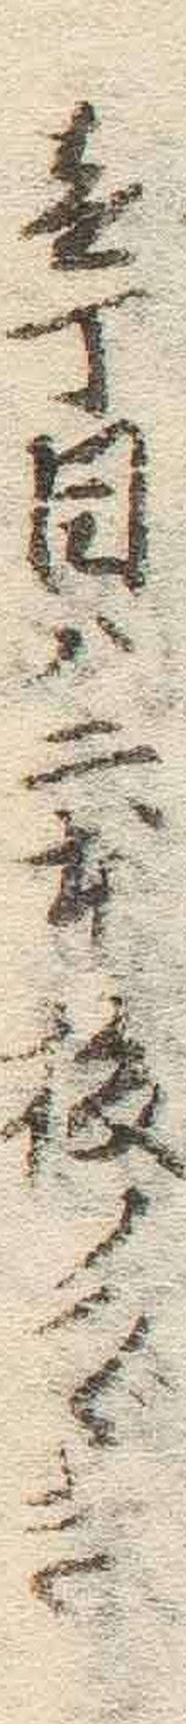壱丁目は二本榎ノつゞき
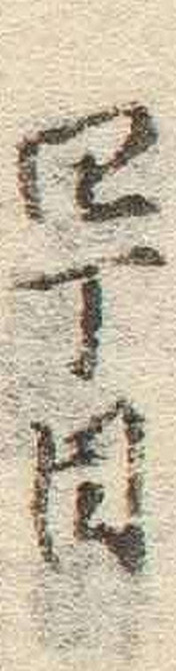四丁目
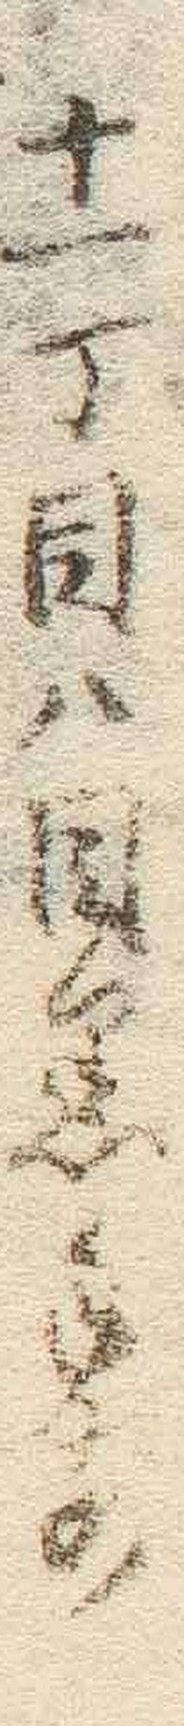十一丁目は目黒手前
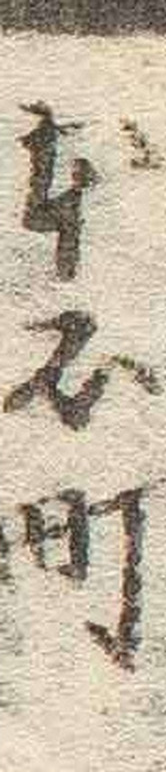本石町
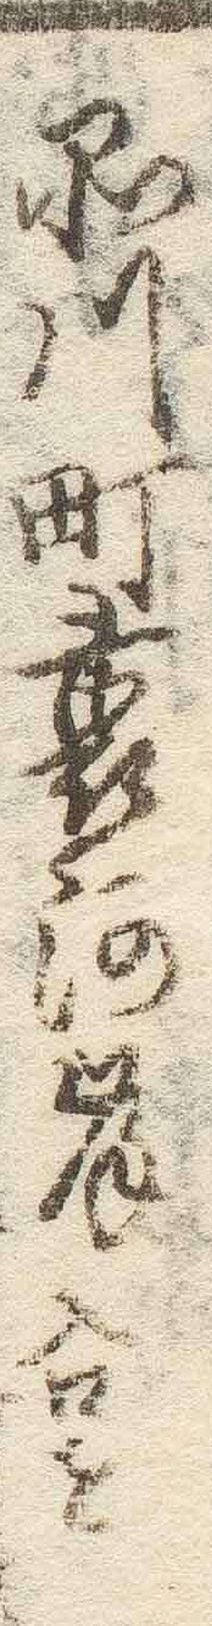品川町裏河岸入口を
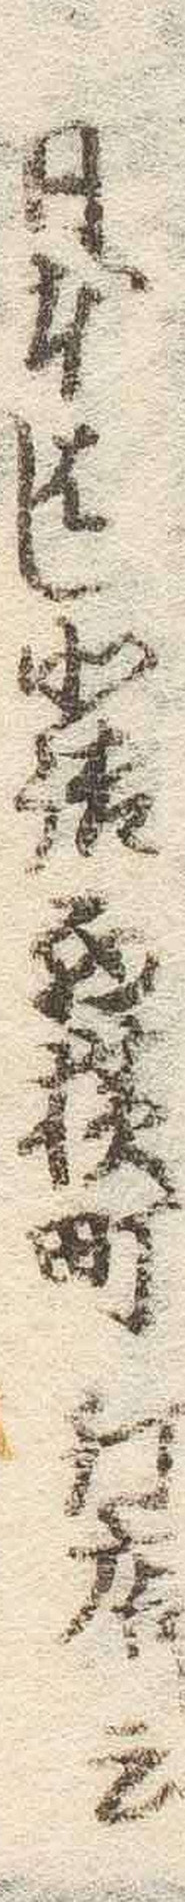日本はし北詰西横町釘店ト云
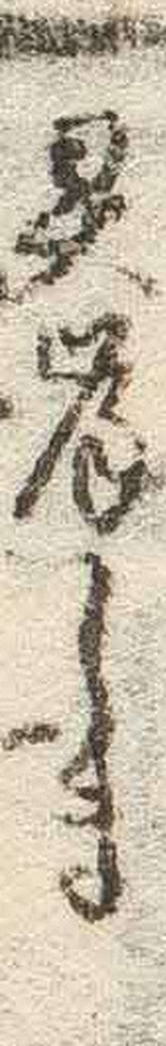霊岸しま
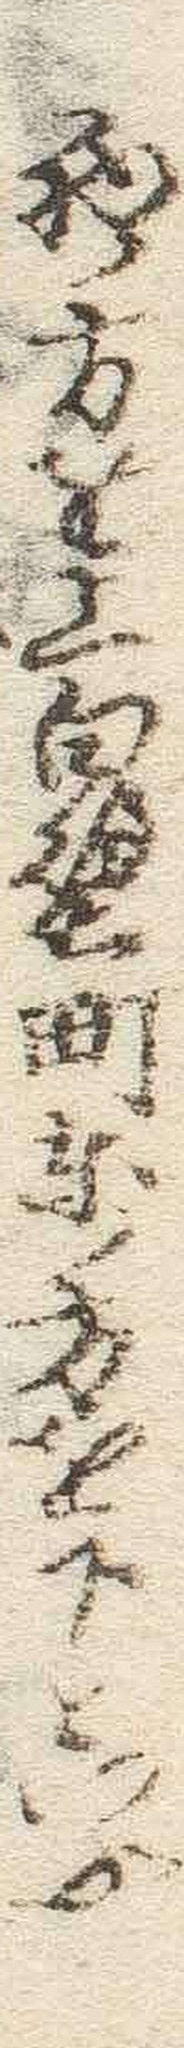西ノ方を上白壁町東ノ方を下といふ
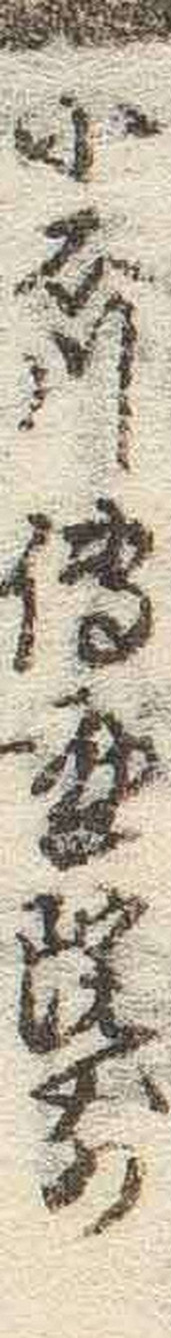小石川伝通院前
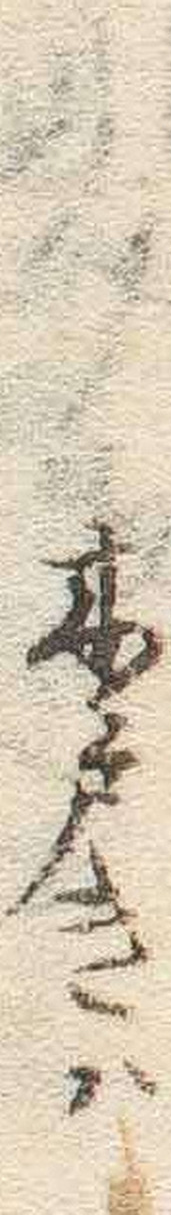木戸きは
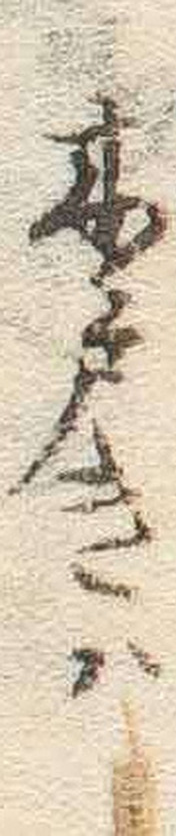木戸きは
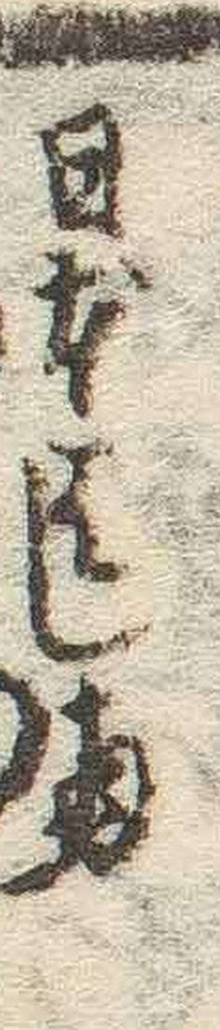日本はし南
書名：江戸町独案内
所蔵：東京学芸大学附属図書館 国文学研究資料館
